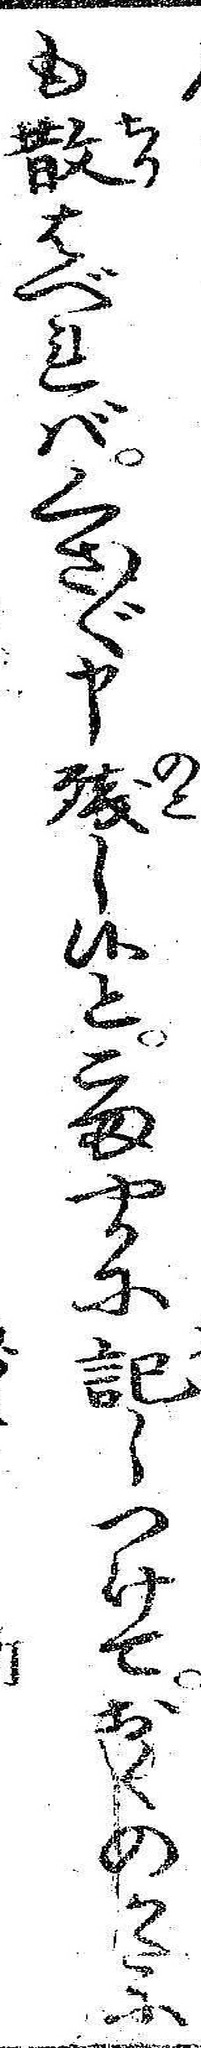も散はべれば。くさ〴〵申残し候と。こまやかに記しつけて。おくのかたに
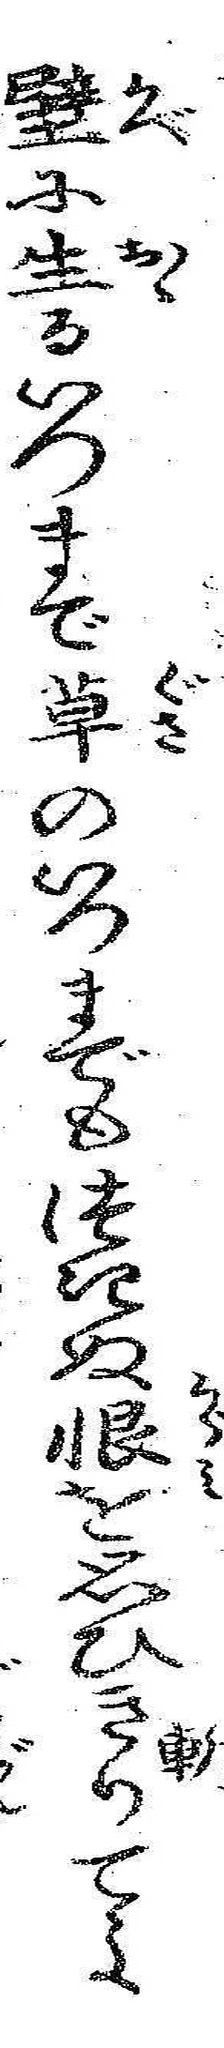壁に生るいつまで草のいつまでもつきぬ恨を思ひきりてよ
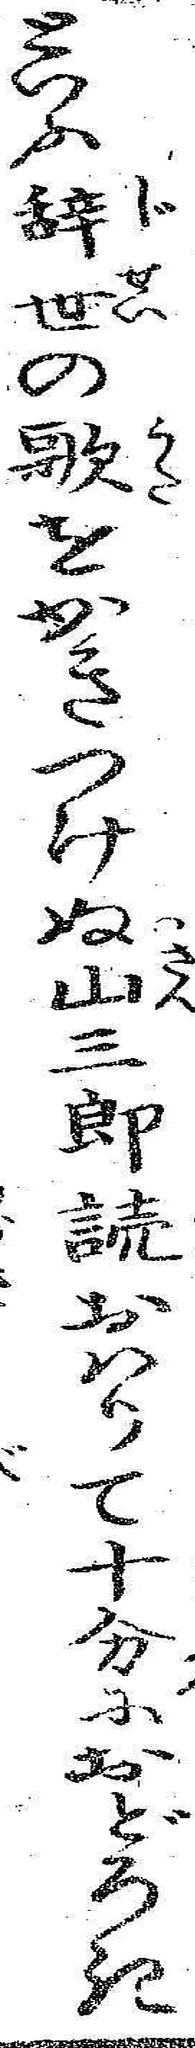といふ辞世の歌をかきつけぬ。山三郎読おはりて十分におどろき
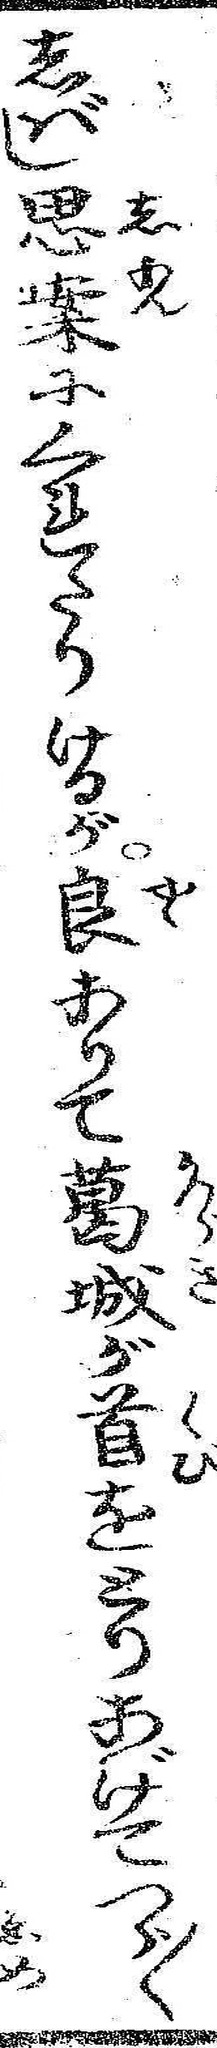しばし思案にくれたりけるが。良ありて葛城が首をとりあげてつら〳〵
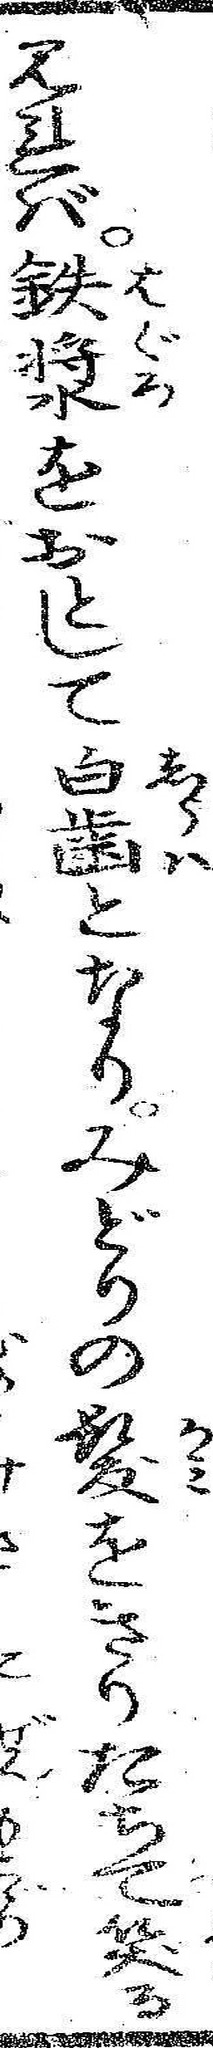見れば。鉄漿をおとして白歯となり。みどりの髪をきりたちて。笑る
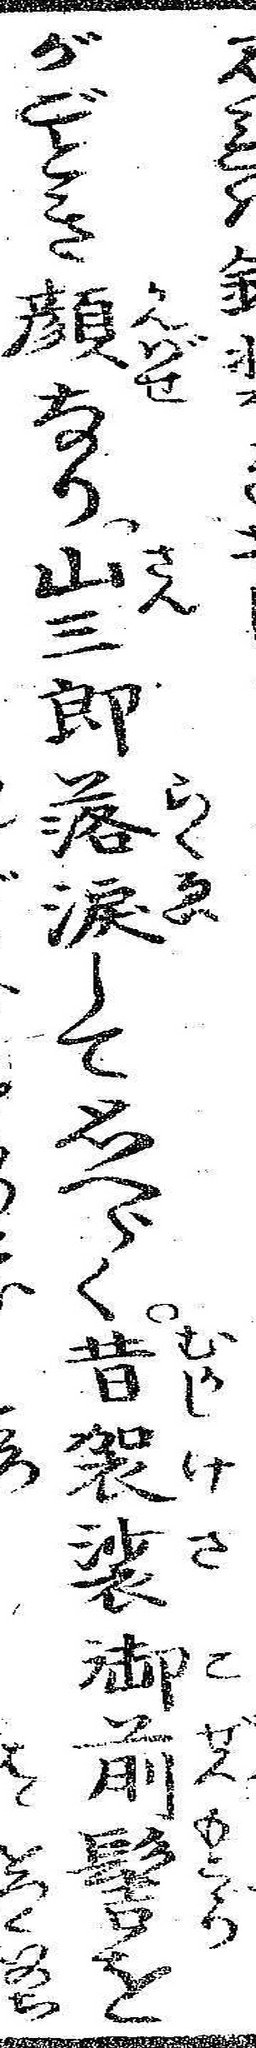がごとき顔なり。山三郎落涙して思へらく。昔袈裟御前髻を
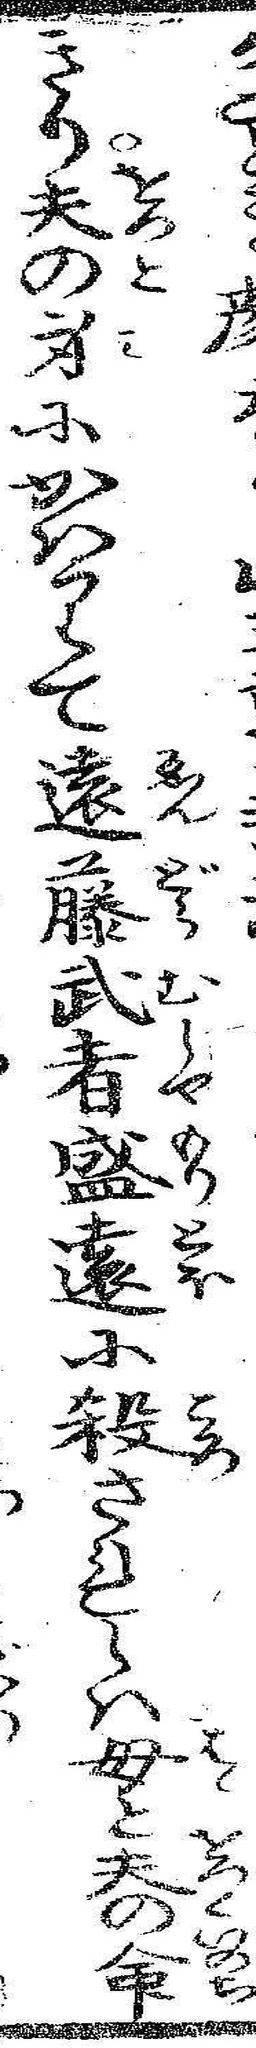きり。夫の身にかはりて遠藤武者盛遠に殺されしは。母と夫の命
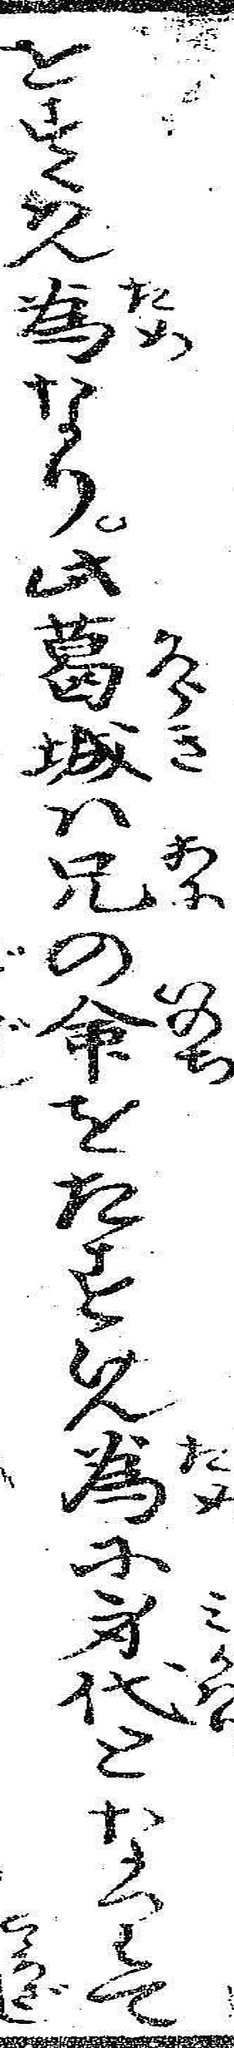をすくはん為なり。此葛城は兄の命をたすけん為に身代となりて
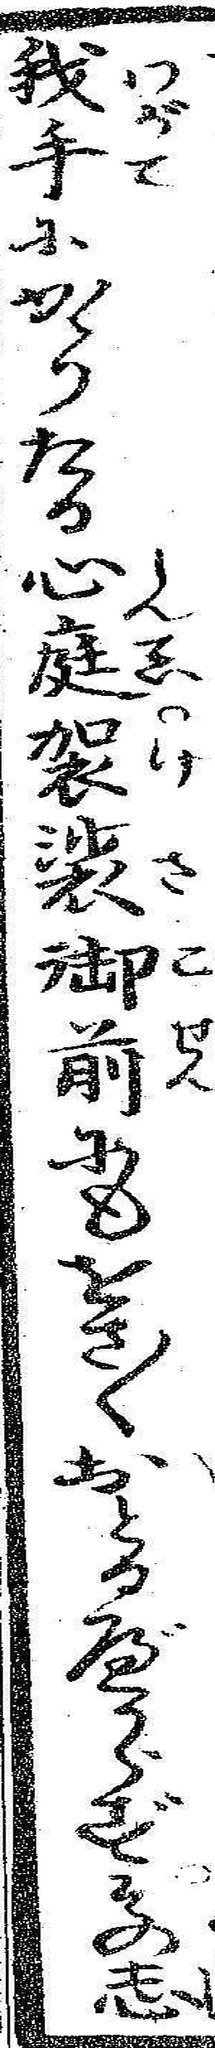我手にかゝりたる心庭。袈裟御前にもをさ〳〵おとるべからず。その志
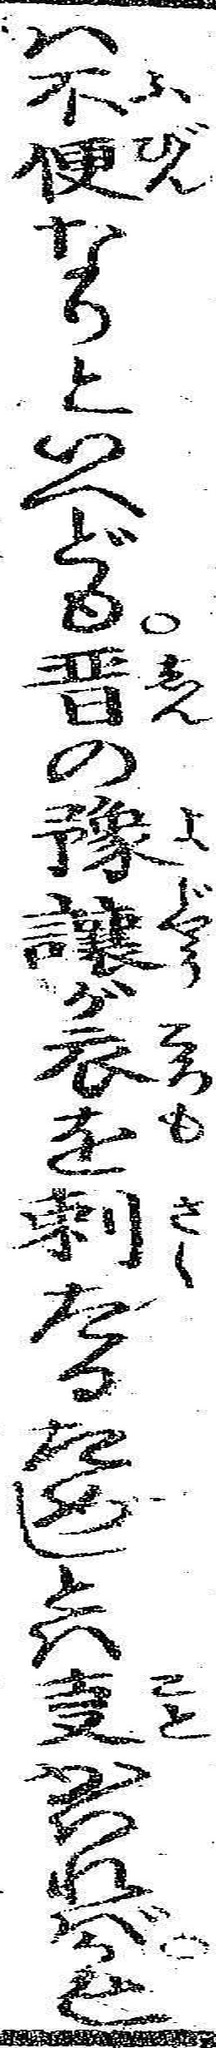は不便なりといへども。晋の予譲が衣を刺たるためしとは事かはれば。かれ
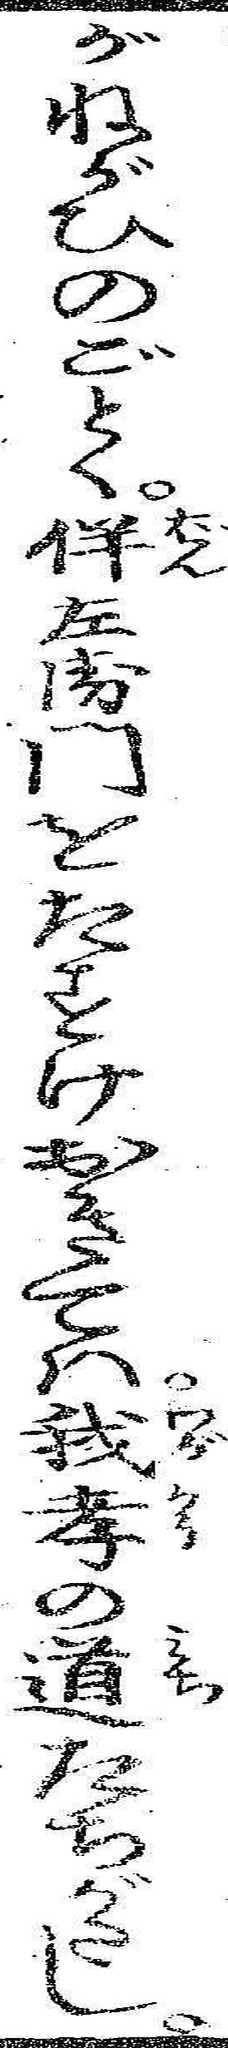がねがひのごとく。伴左衛門をたすけおきては。我孝の道たちがたし。
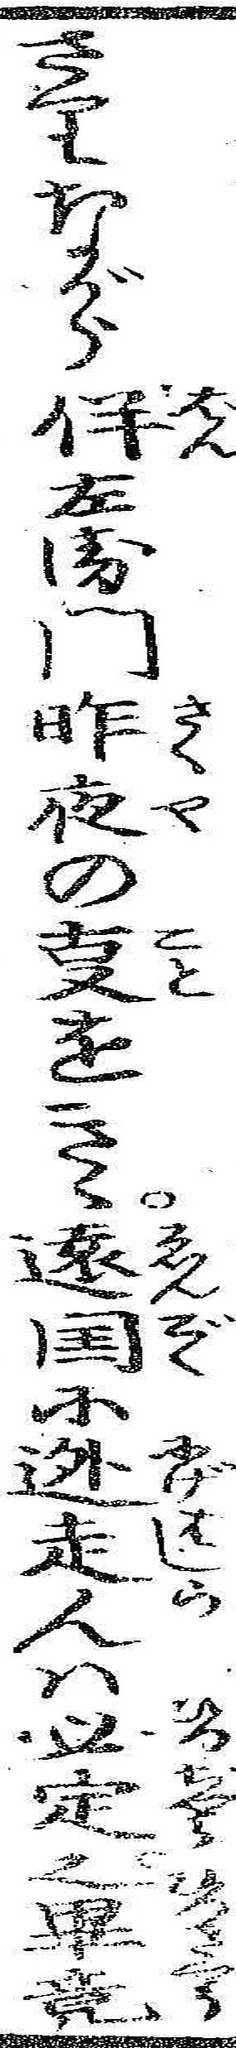さりながら伴左衛門昨夜の事をきゝ。遠国に逃走んは必定也。畢竟
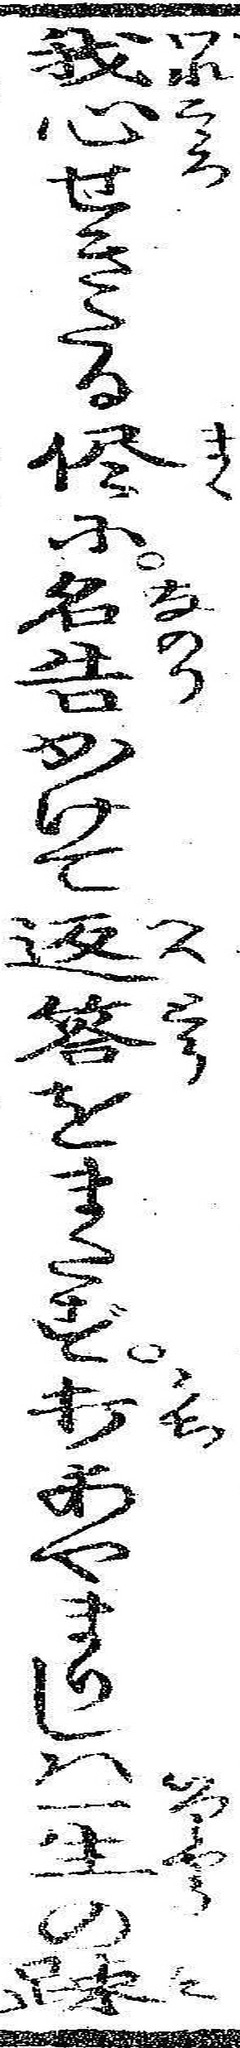我心せきたる侭に。名告かけて返答をまたず。打あやまりしは一生の疎
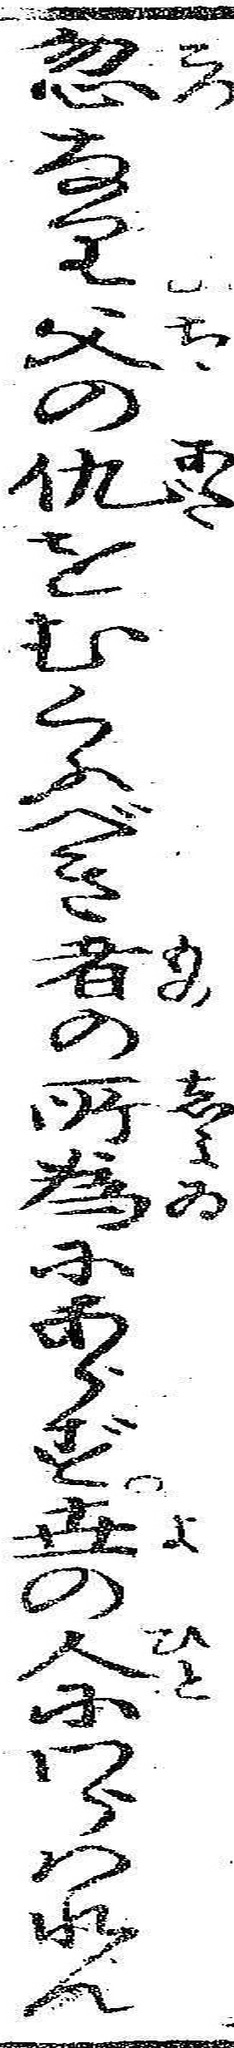忽なり。父の仇をむくふべき者の所為にあらず。世の人にわらはれん
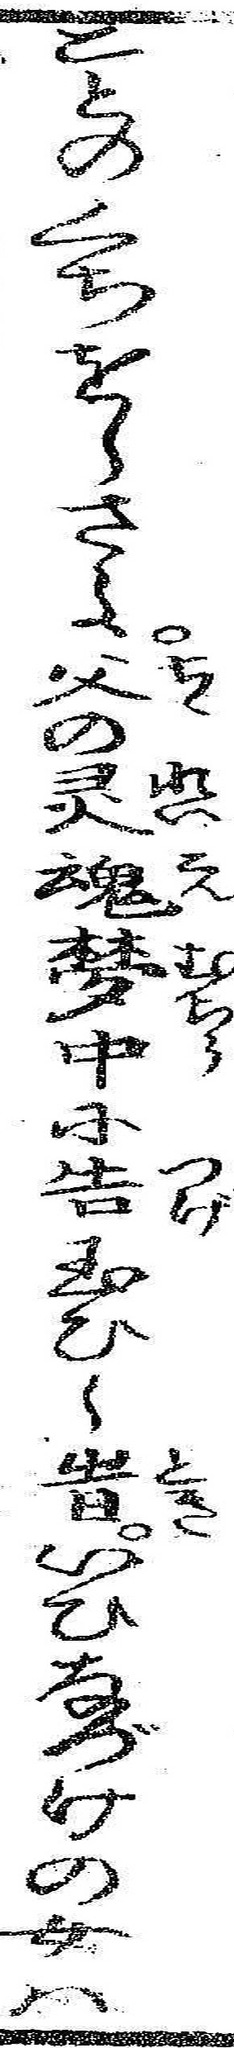ことのくちをしさよ。父の霊魂夢中に告玉ひし時。いひなづけの女は
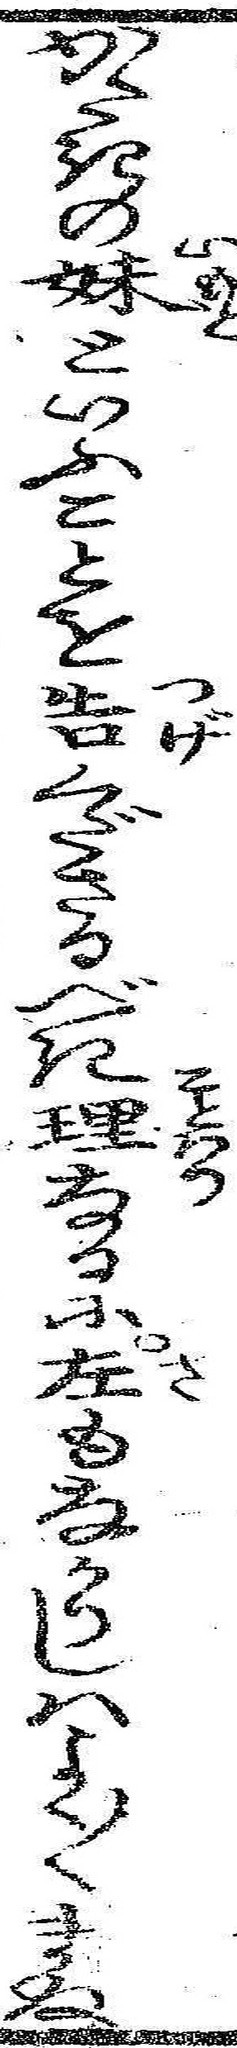かたきの妹といふことを告くださるべき理なるに。左もなかりしはよく〳〵まぬ
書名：昔話稲妻表紙
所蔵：国文学研究資料館
